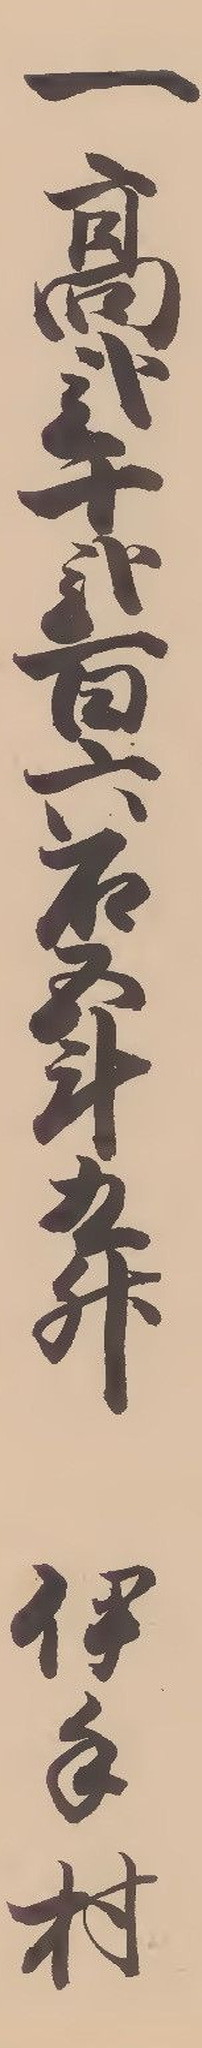一高弐千弐百六石五斗九升伊手村

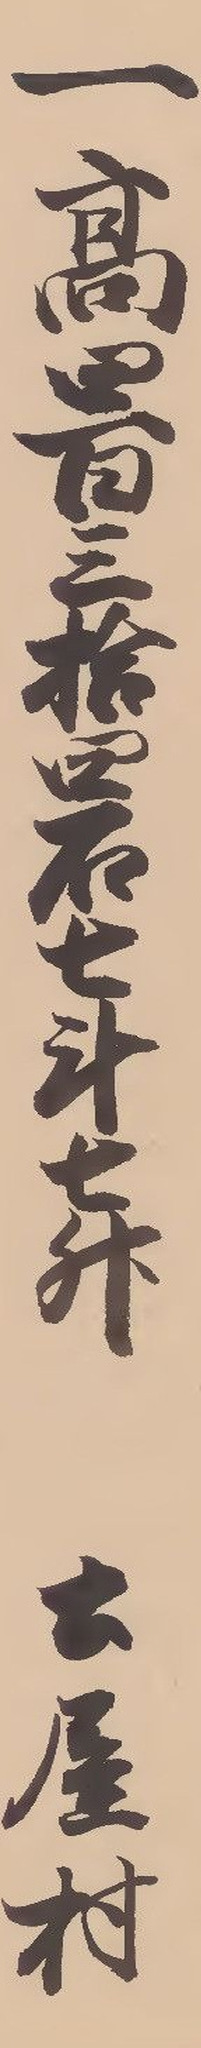一高四百三拾四石七斗七升土屋村
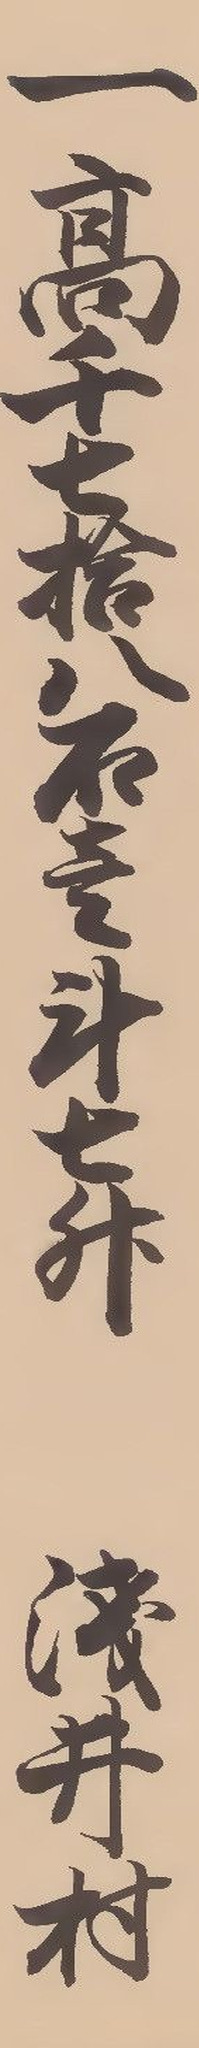一高千七拾八石壱斗七升浅井村
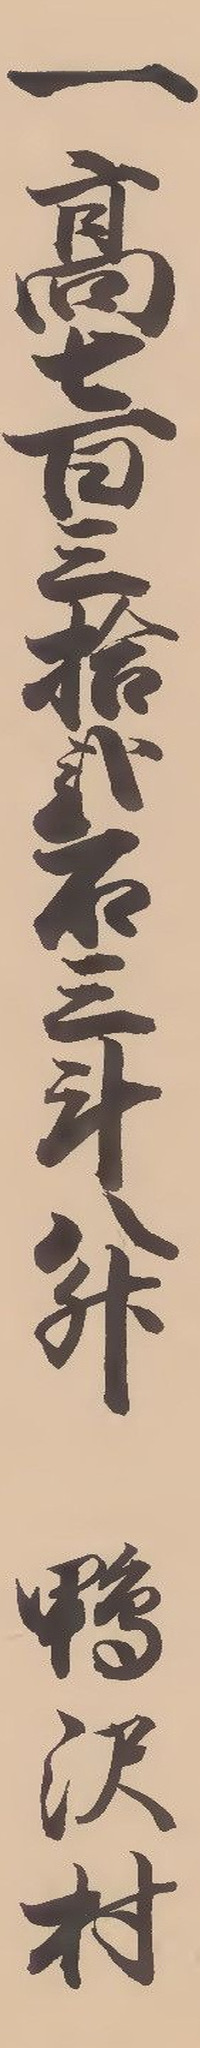一高七百三拾弐石三斗八升鴨沢村
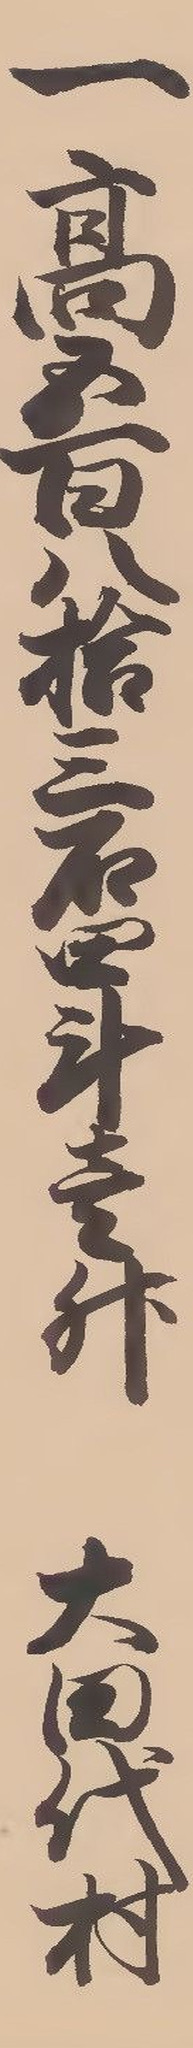一高五百八拾三石四斗壱升大田代村
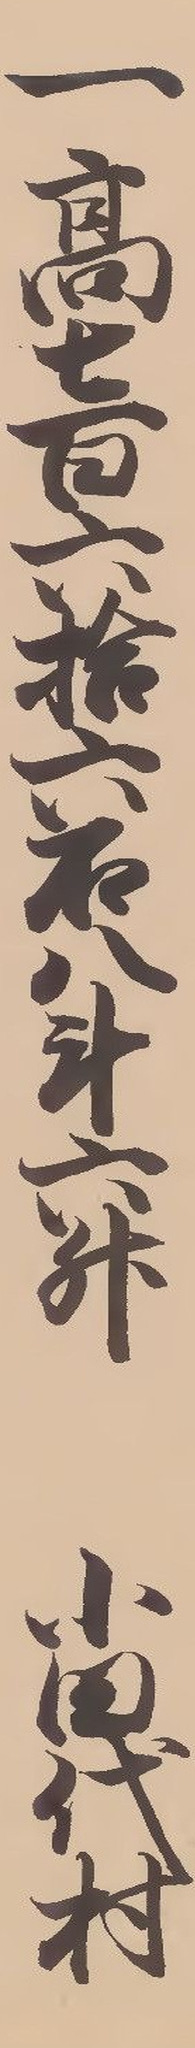一高七百六拾六石八斗六升小田代村
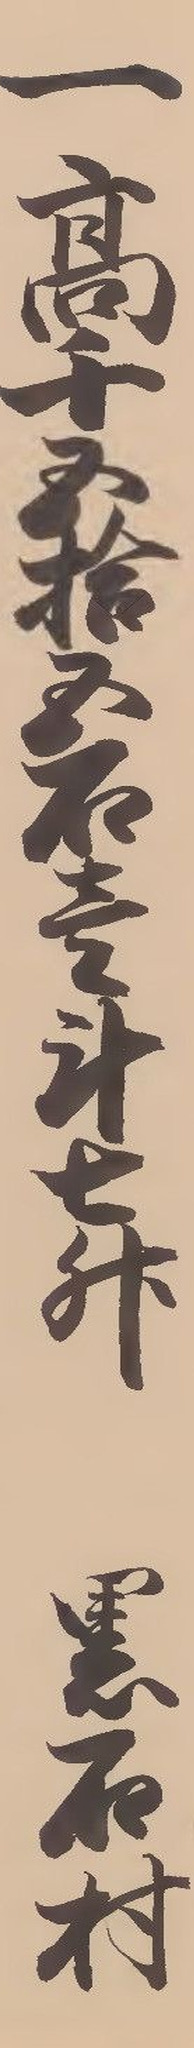一高千五拾五石壱斗七升黒石村
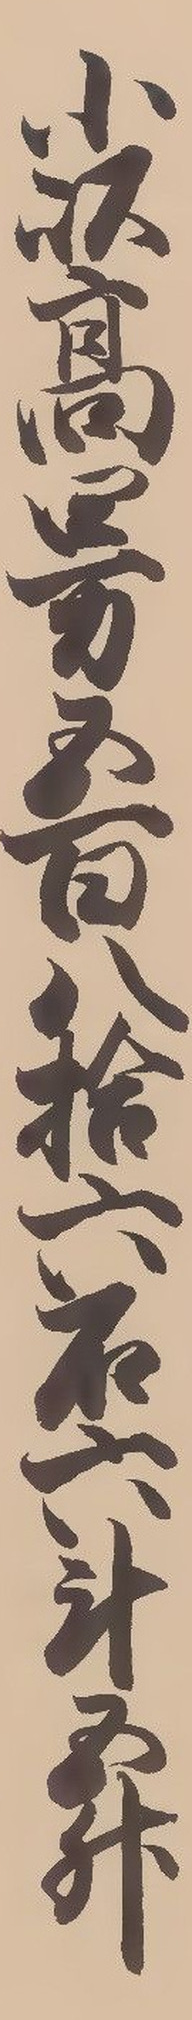小以高四万五百八拾六石六斗五升

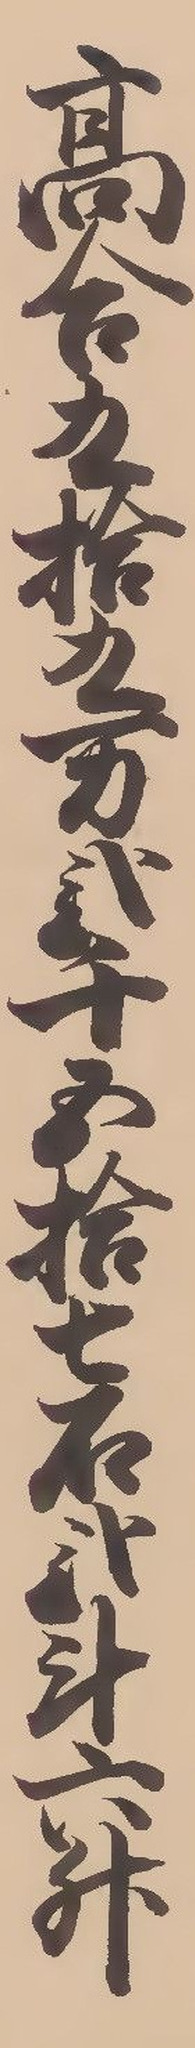高合九拾九万弐千五拾七石弐斗六升
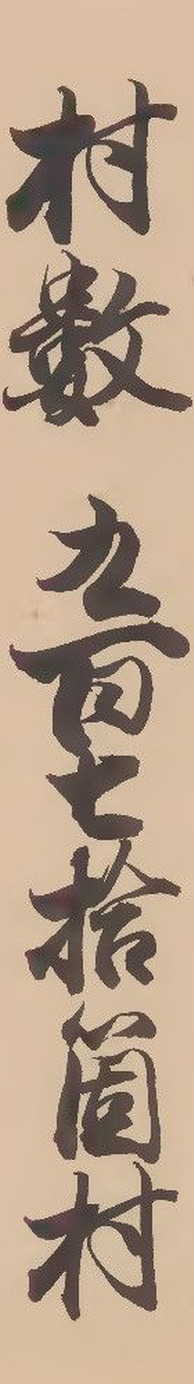村数九百七拾箇村
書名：陸奥国郷帳　５
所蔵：国立公文書館 National Archives of Japan
